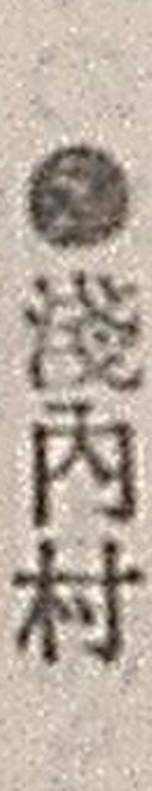●寺内村
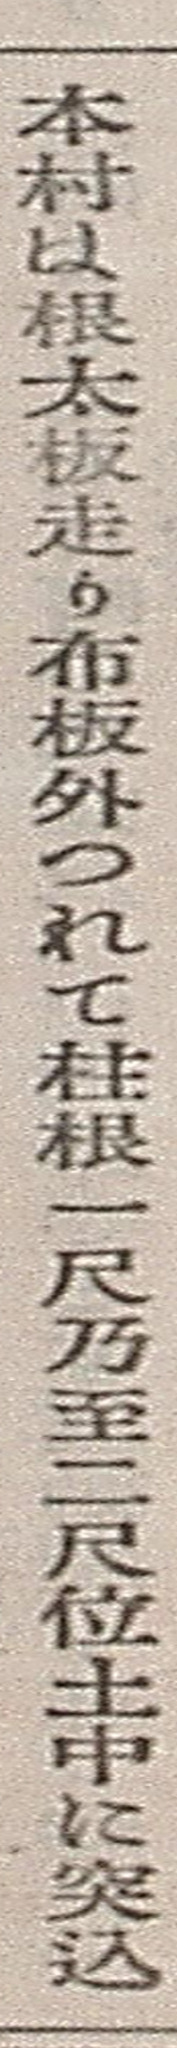本村は根太板走り布板外つれて柱根一尺乃至二尺位土中に突込
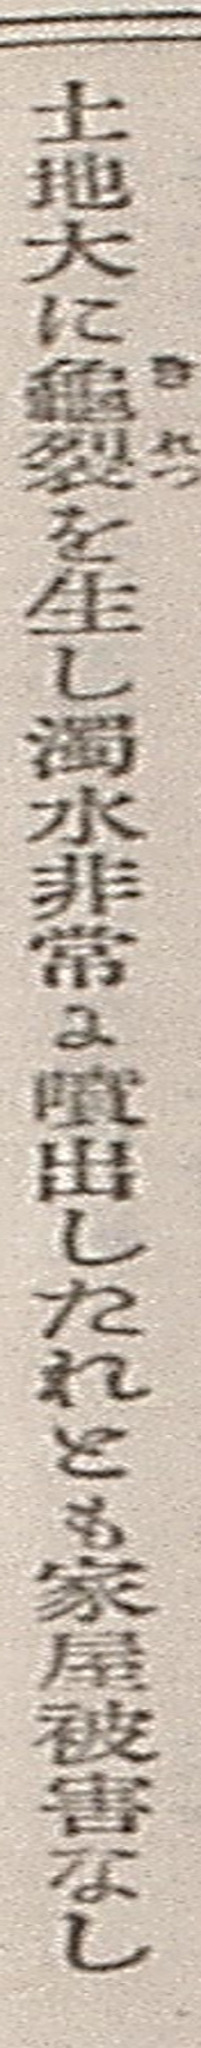土地大に亀裂を生し濁水非常に噴出したれとも家屋被害なし
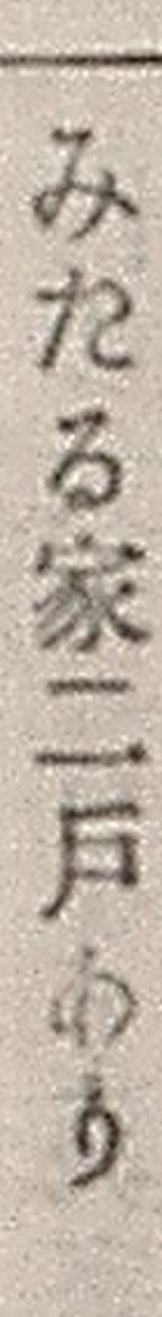みたる家二戸あり
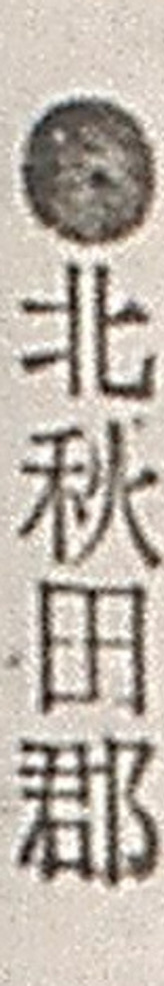●北秋田郡
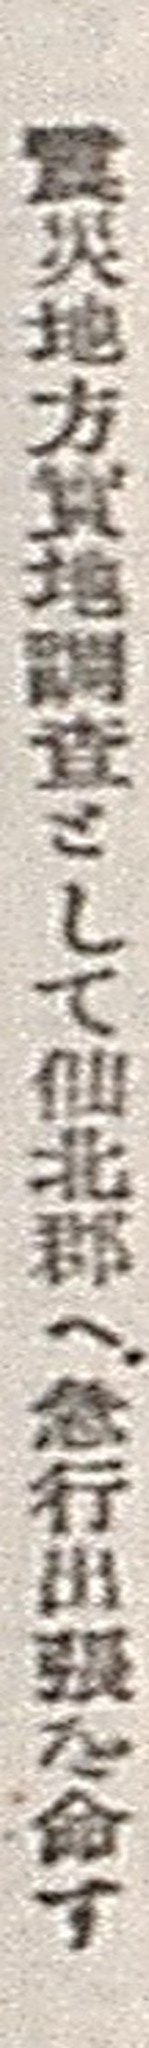震災地方実地調査として仙北郡へ急行出張を命す
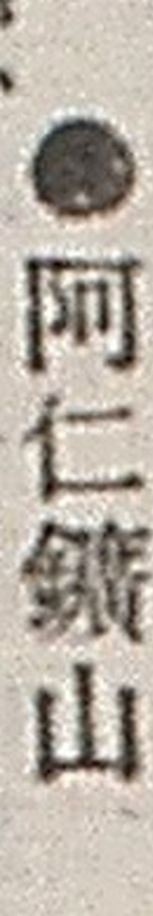●阿仁鉱山
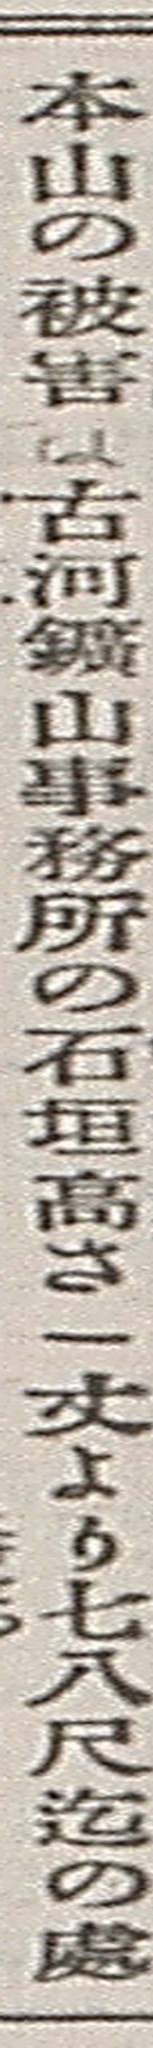本山の被害は古河鉱山事務所の石垣高さ一丈より七八尺迄の処
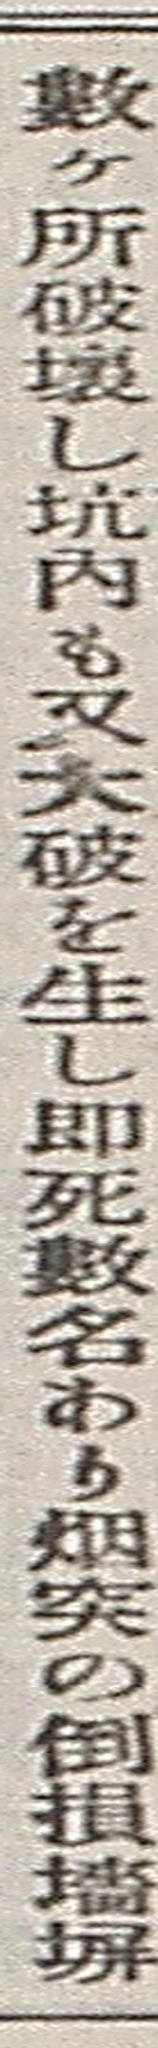数ケ所破壊し坑内も又大破を生し即死数名あり烟突の倒損墻塀
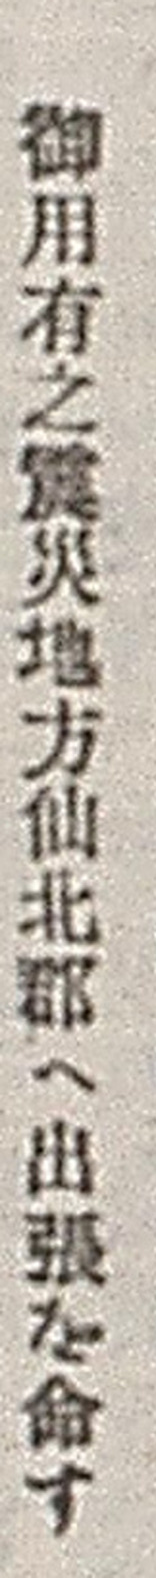御用有之震災地方仙北郡へ出張を命す
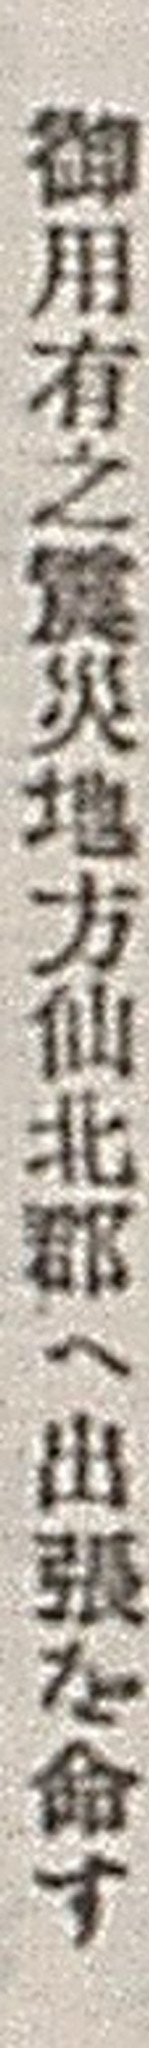御用有之震災地方仙北郡へ出張を命す
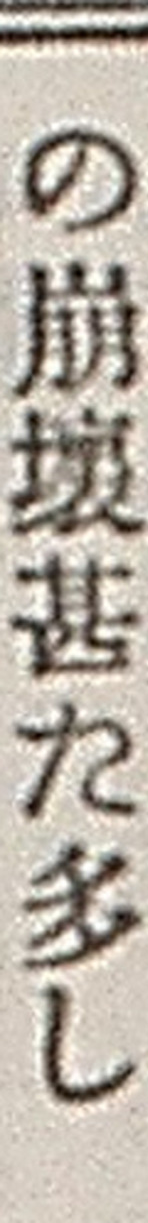の崩壊甚た多し
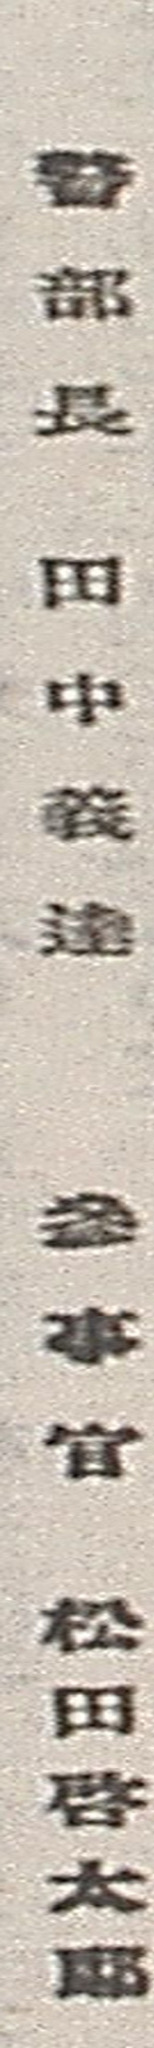警部長田中義達参事官松田啓太郎
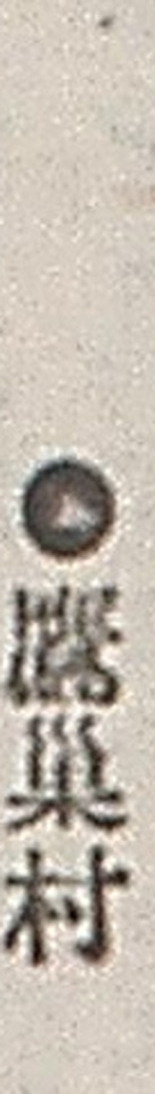●鷹巣村
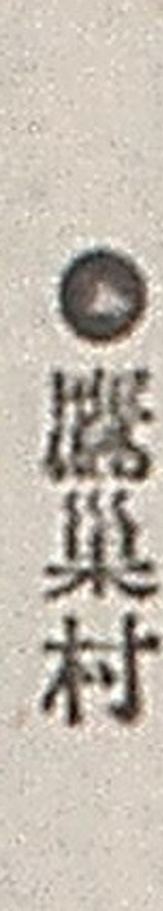●鷹巣村
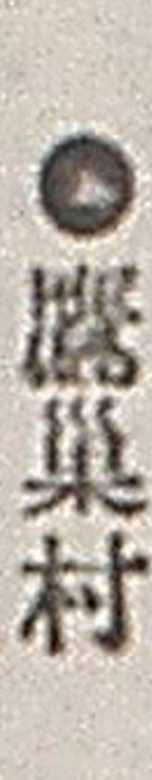●鷹巣村
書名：風俗畫報臨時増刊第百二十四號　洪水地震被害録（上）
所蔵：東京大学地震研究所図書室 Earthquake Research Institute Library, The University of Tokyo, JAPAN
